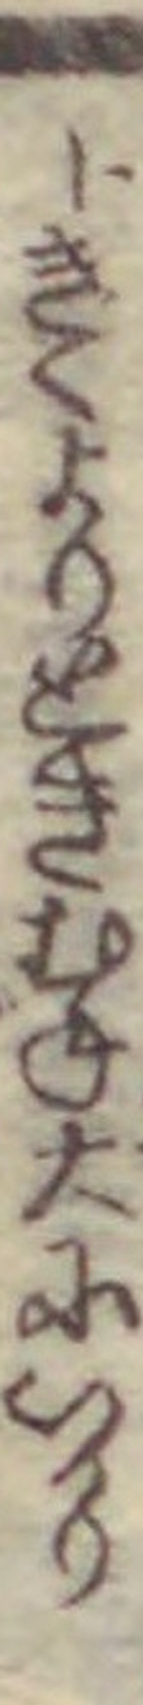ときくよりときむね大にいかり
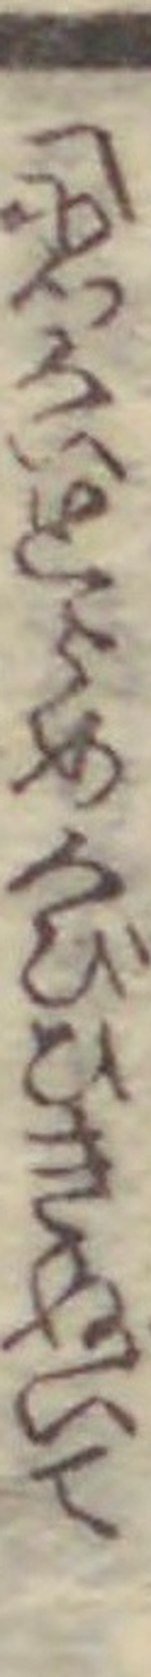〽につくいとらめくびひきぬいて
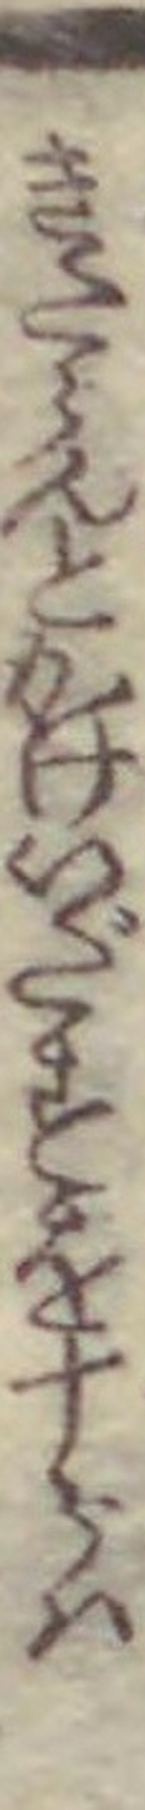きたらんとかけいだすを十郎は
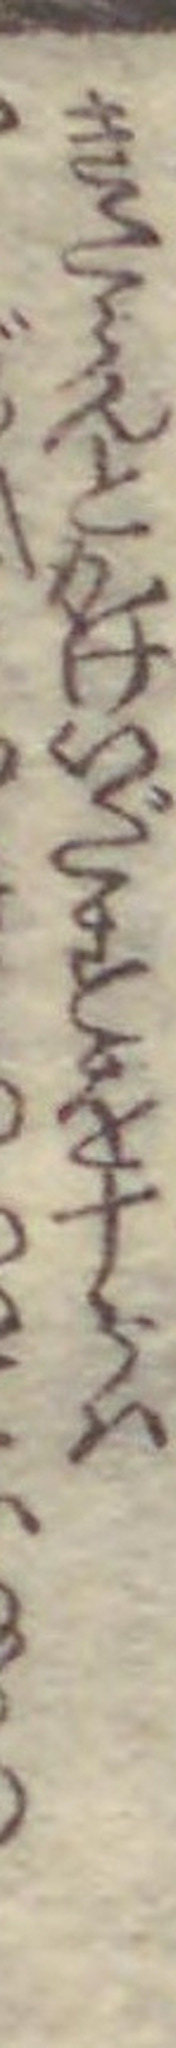きたらんとかけいだすを十郎は
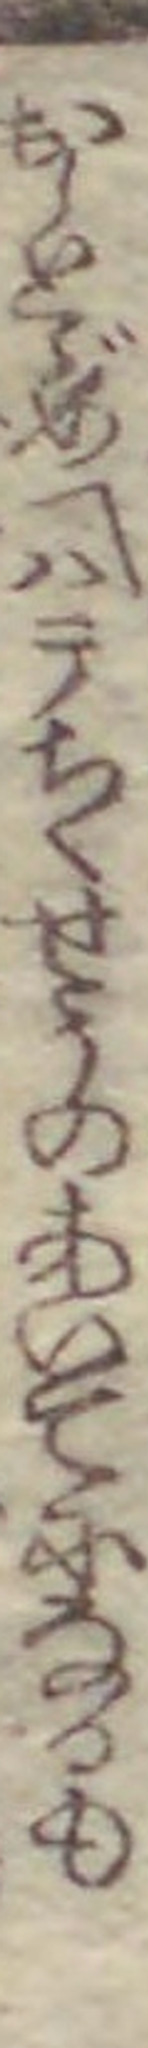おしとゞめ〽ハテちくせうのあいてになるも
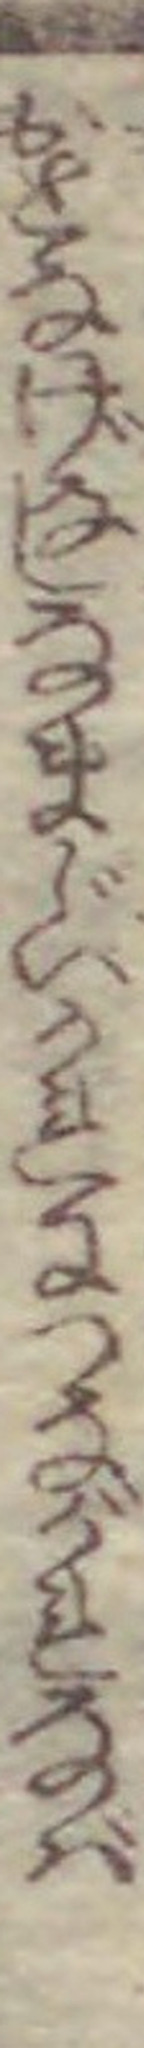おとなげなしなまじいかれにつながれなば
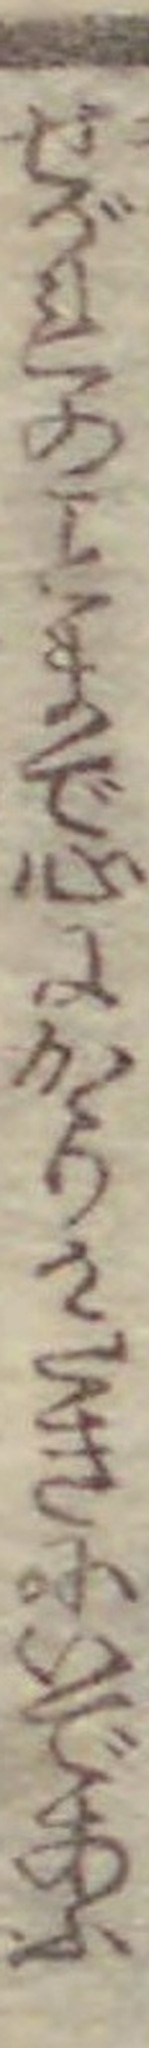せがきのことまで心にかゝりかたきにいであふ
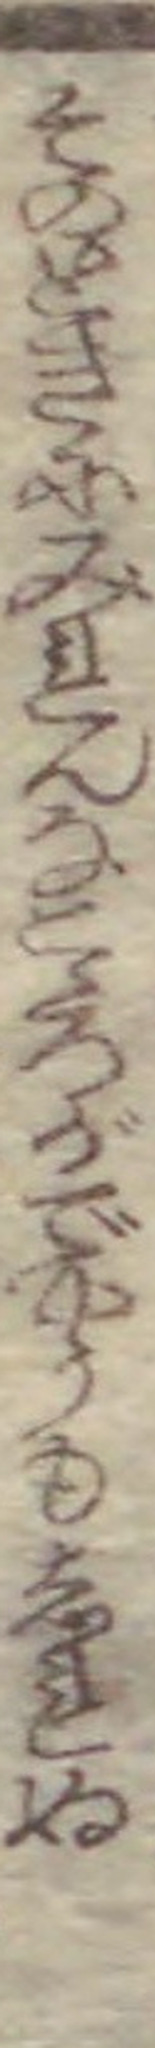そのときにみれんなこゝろがでやうもしれぬ
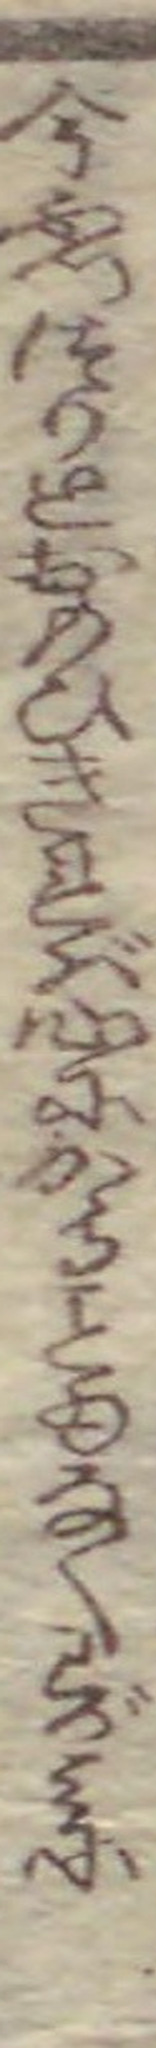今ふつつりとおもひきれば心にかゝることもなくわがみに
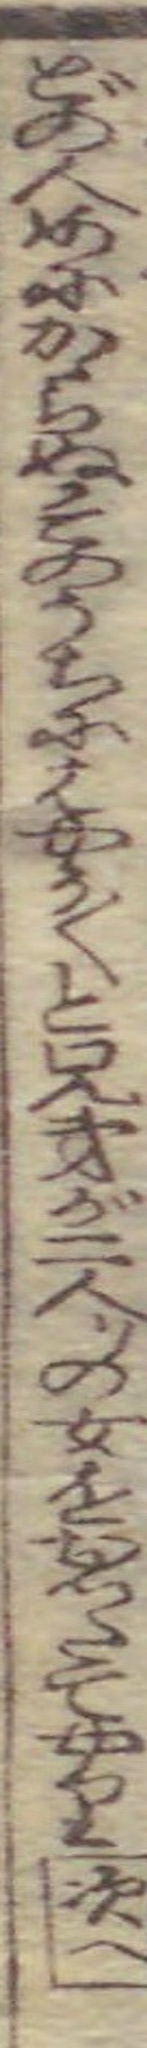どの人めにかゝらぬそのうちにはやう〳〵と兄弟が二人居の女をおつたてやり次へ

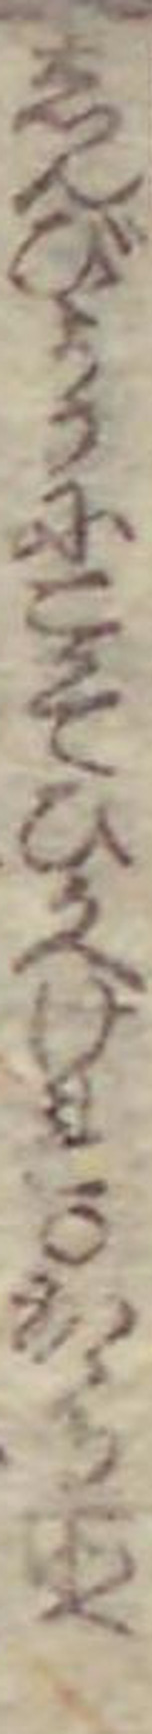しんびようにこそひかへけれ○かゝる所へ
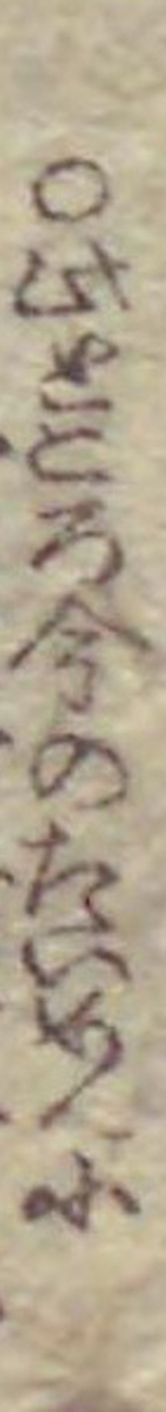○此ところ今のたいめんに
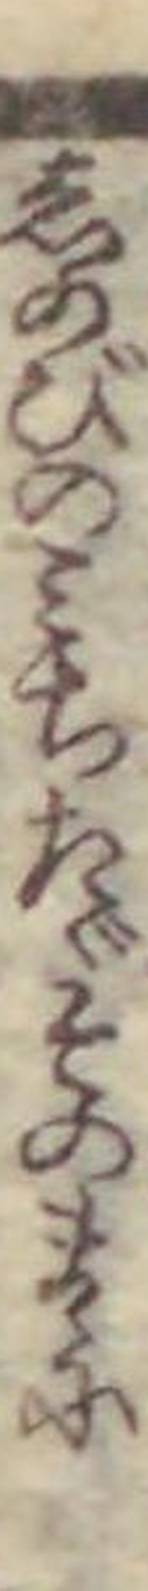しのびのみちたゞそのまゝに
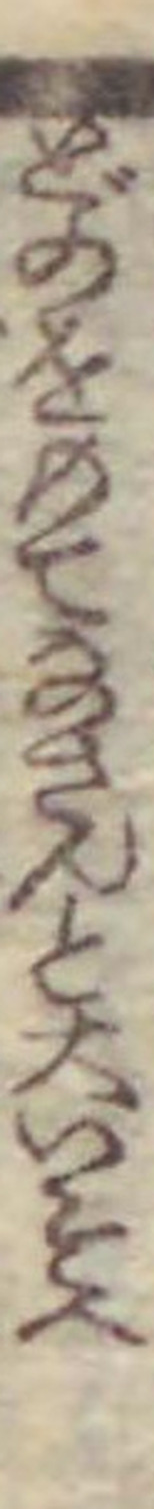どのをもてなさんと大いそへ
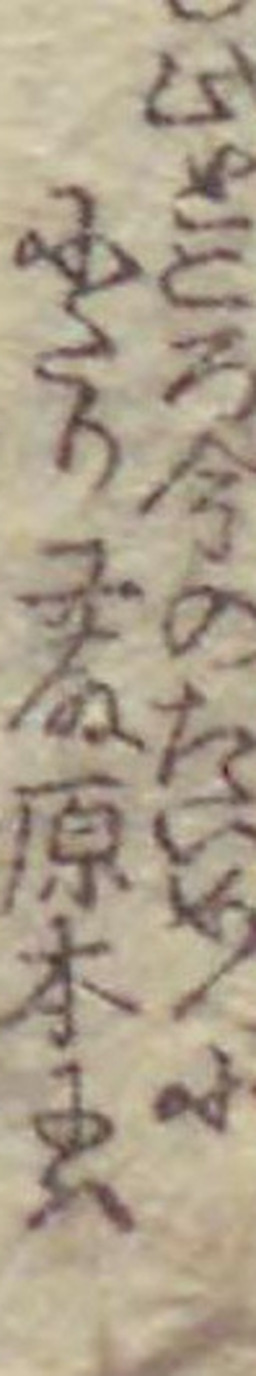にたり工藤原本には
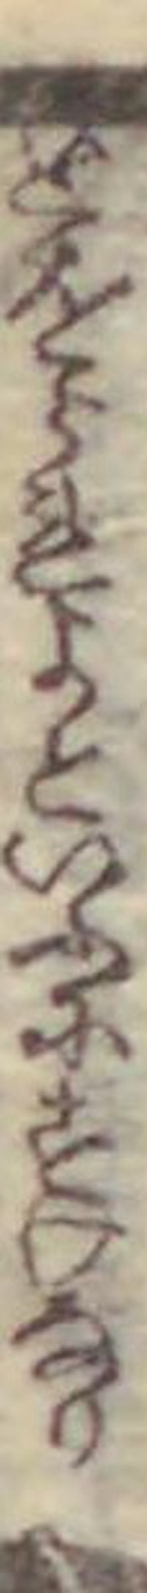とをられよといふにすけなり
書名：大時代唐土化物 3巻. 曽我太夫染
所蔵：国立国会図書館 National Diet Library, JAPAN
